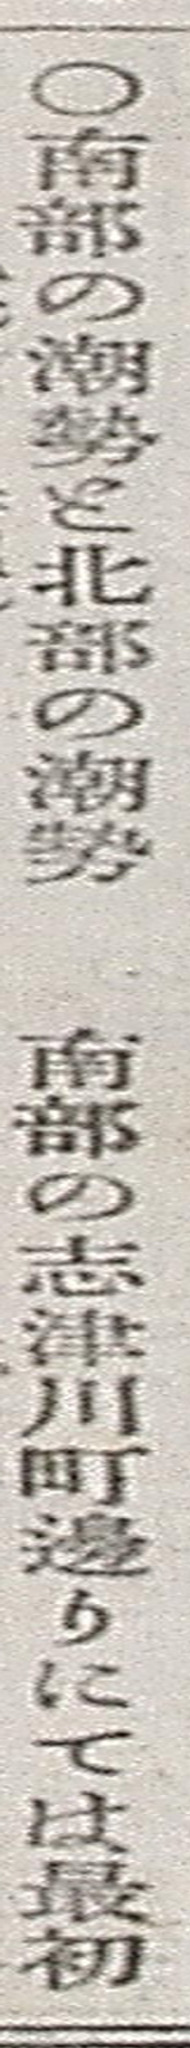○南部の潮勢と北部の潮勢南部の志津川町辺りにては最初
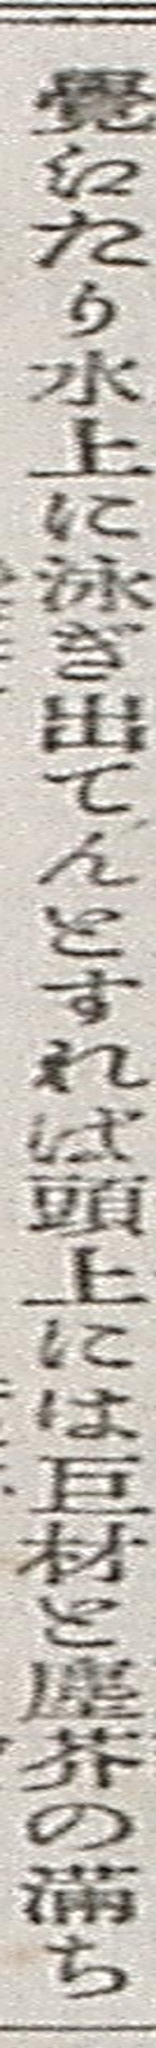覚えたり水上に泳ぎ出てんとすれば頭上には巨材と塵芥の満ち
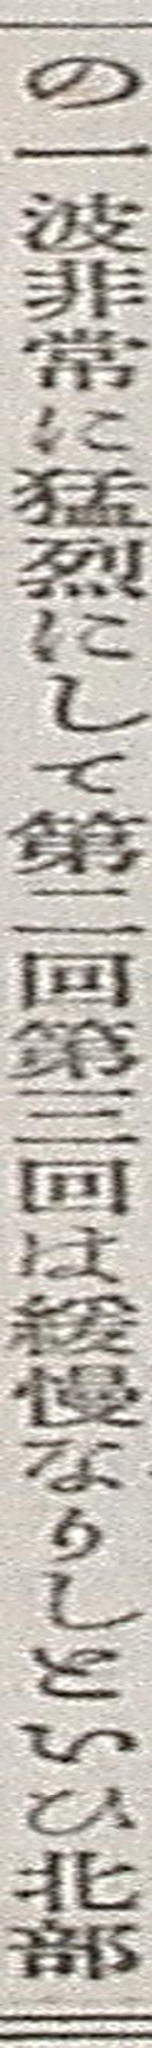の一波非常に猛烈にして第二回第三回は緩慢なりしとといひ北部
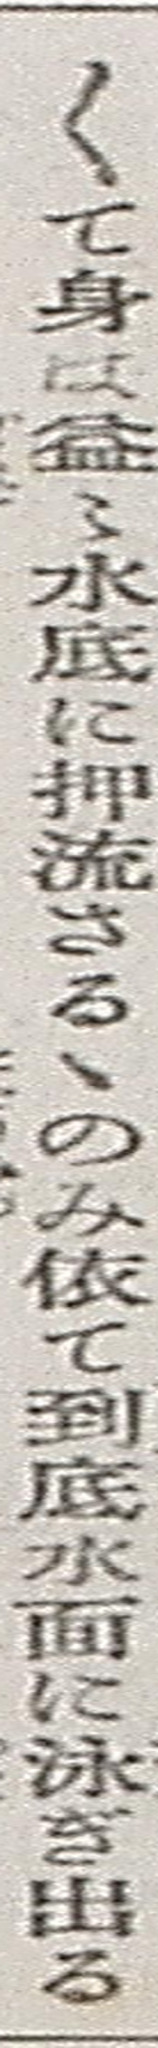〳〵て身は益々水底に押流さるゝのみ依て到底水面に泳ぎ出る
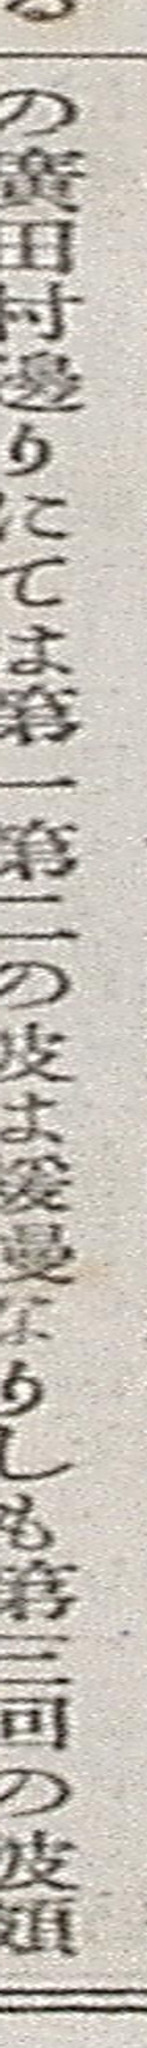の広田村辺りにては第一第二の波は緩慢なりしも第三回の波頗
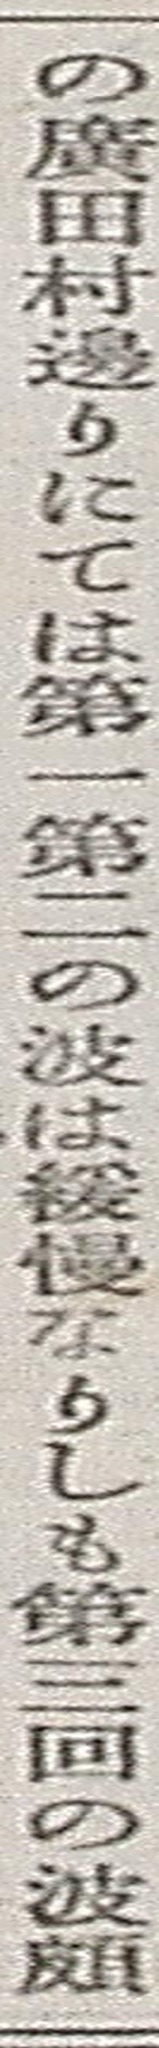の広田村辺りにては第一第二の波は緩慢なりしも第三回の波頗
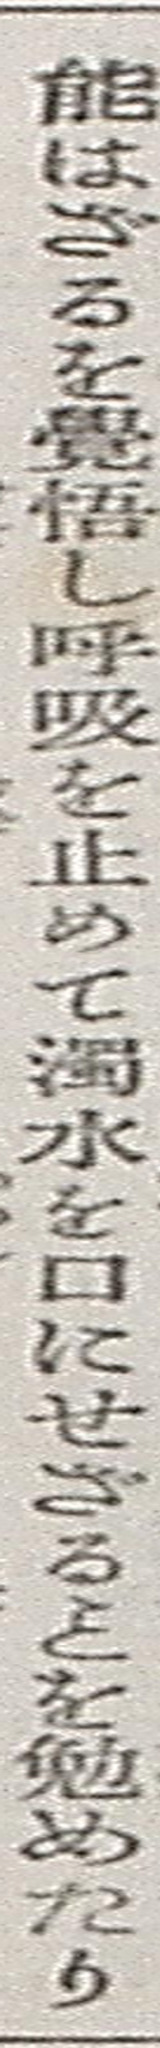能はざるを覚悟し呼吸を止めて濁水を口にせざることを勉めたり
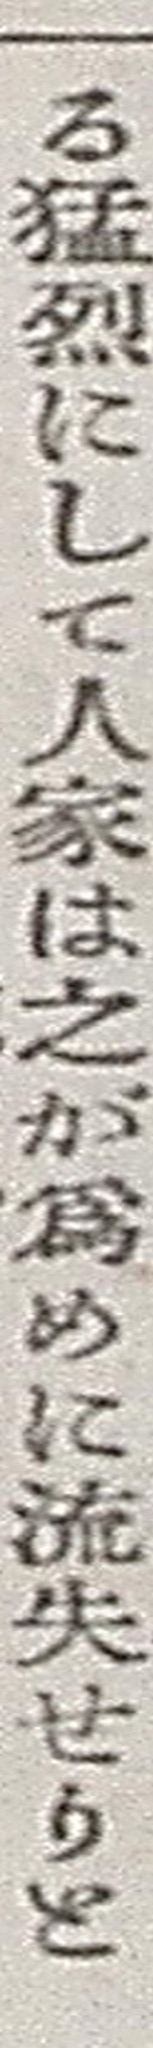る猛烈にして人家は之が為めに流失せりと
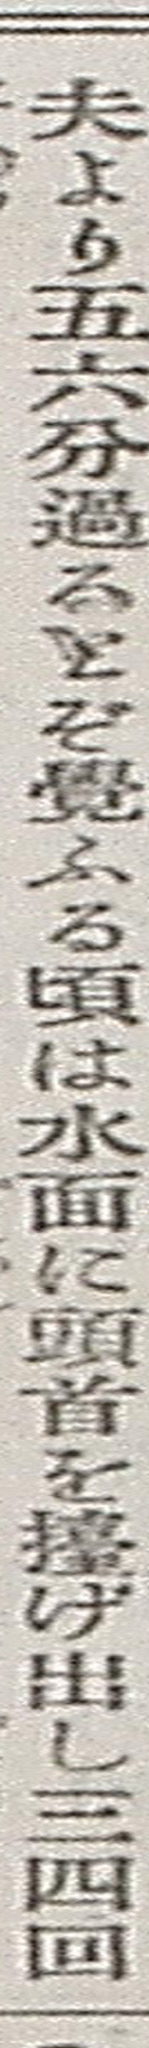夫より五六分過るとぞ覚ふる頃は水面に頭首を擡げ出し三四回
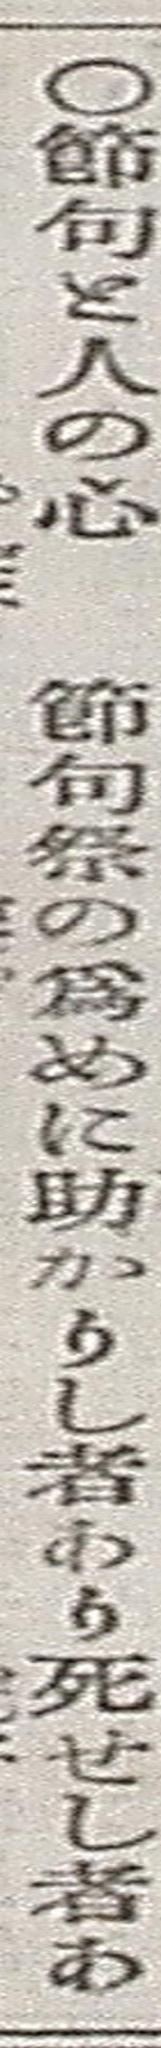○節句と人の心節句祭の為めに助かりし者あり死せし者あ
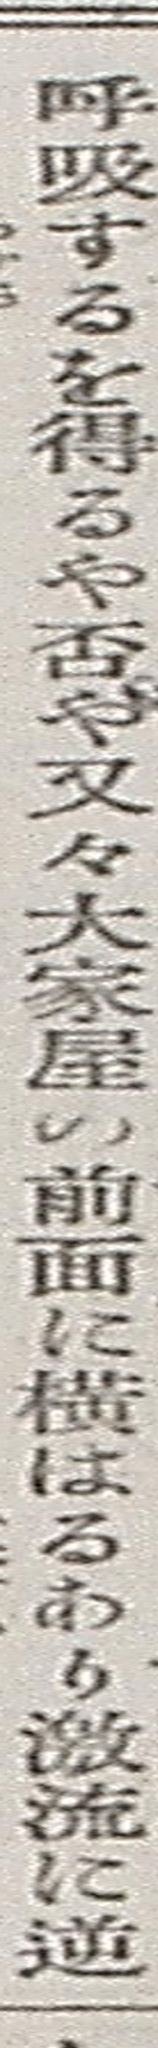呼吸するを得るや否や又々大家屋の前面に横はるあり激流に逆
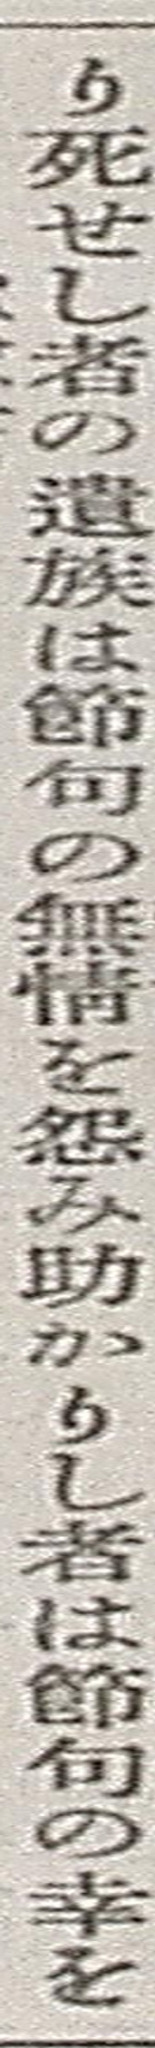り死せし者の遺族は節句の無情を怨み助かりし者は節句の幸を
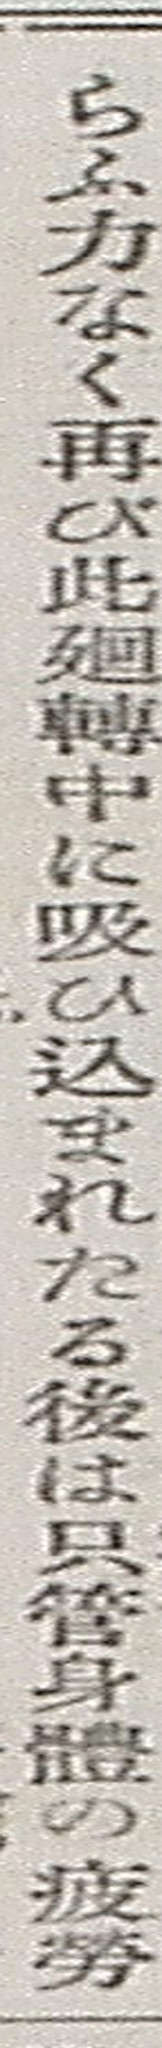らふ力なく再び此廻転中に吸ひ込まれたる後は只管身体の疲労
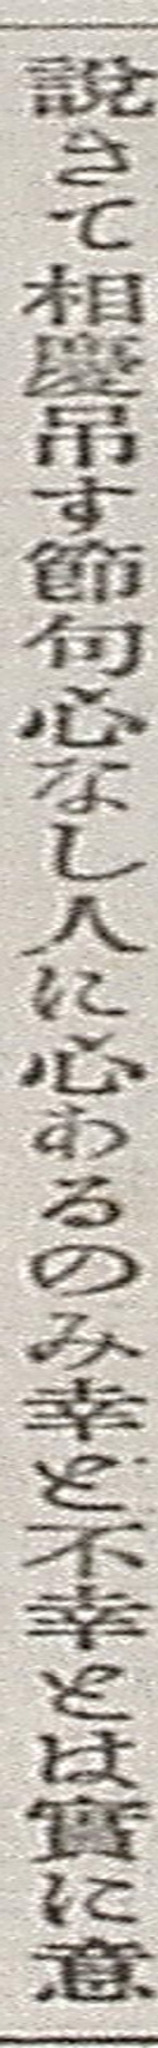説きて相慶吊す節句心なし人に心あるのみ幸と不幸とは実に意
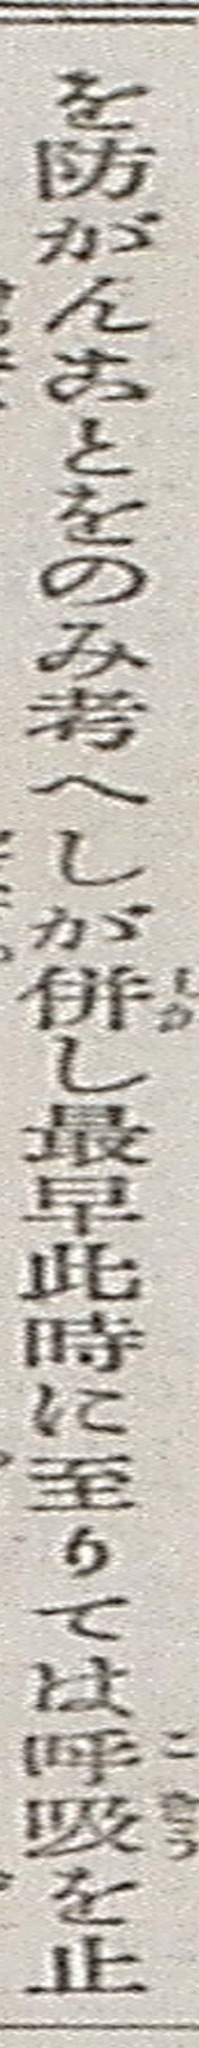を防がんことをのみ考へしが併し最早此時に至りては呼吸を止
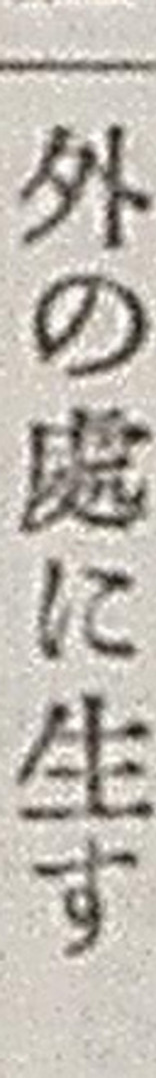外の処に生す
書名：風俗畫報臨時増刊第百二十號　大海嘯被害録（下）
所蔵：東京大学地震研究所図書室 Earthquake Research Institute Library, The University of Tokyo, JAPAN
